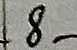8
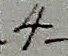4
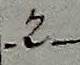2
